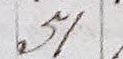51
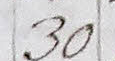30
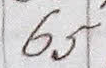65
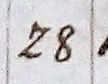28
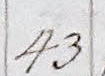43
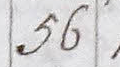56
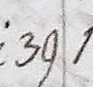39
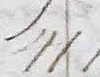41
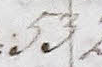53
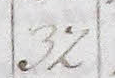32
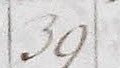39
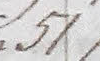51
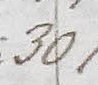30
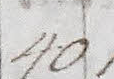40
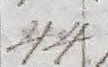44
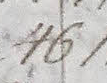46
